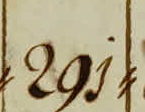291
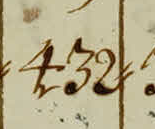432
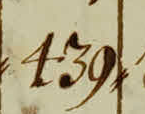439
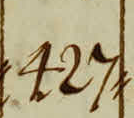427
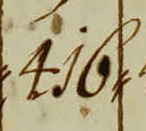416
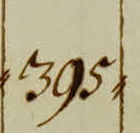395
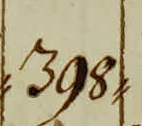398
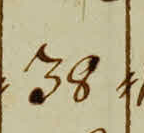38
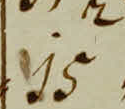15
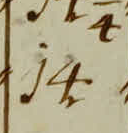14
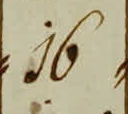16
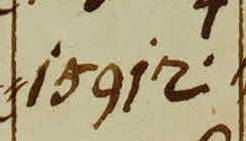15912:
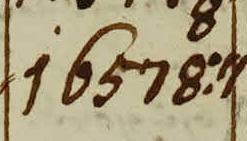16578:
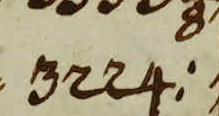3224:
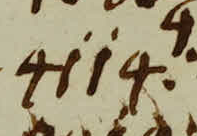4114
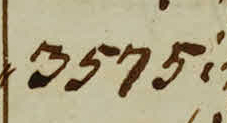3575
